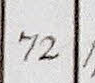72
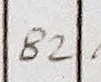82
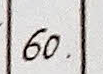60.
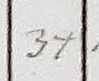34
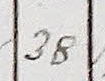38
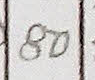80
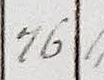76
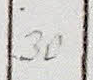30
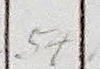54
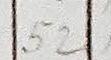52
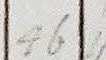46
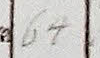64
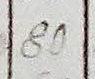80
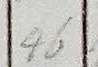46
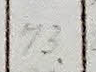73
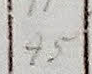45
